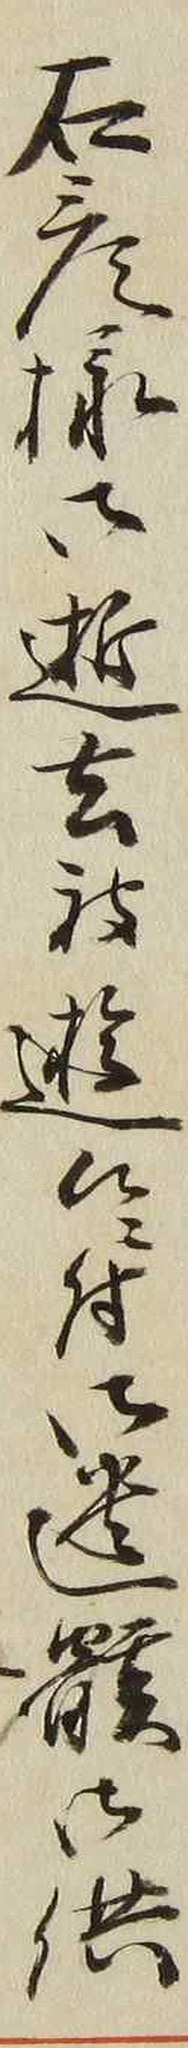石彦様御逝去被遊候に付御遺骸御供
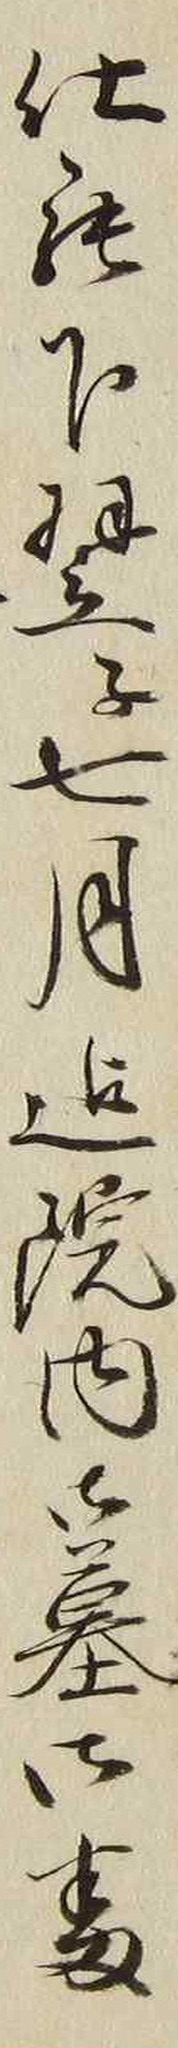仕罷下翌子七月迄院内御墓御番
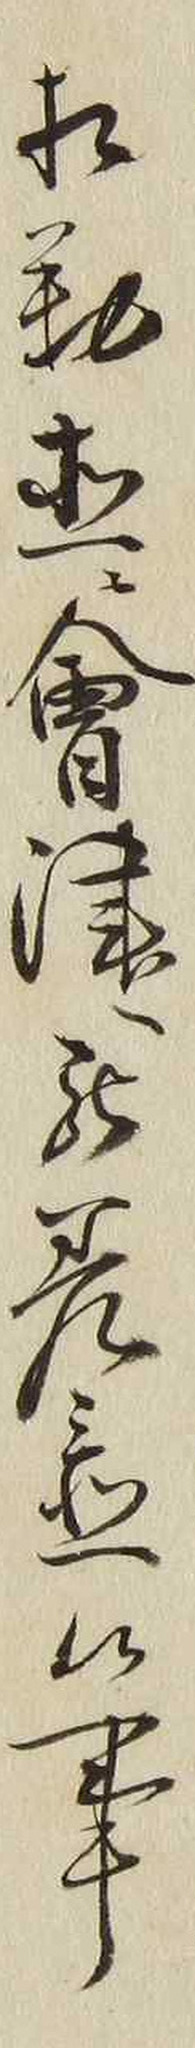相勤直に会津へ罷差置候事
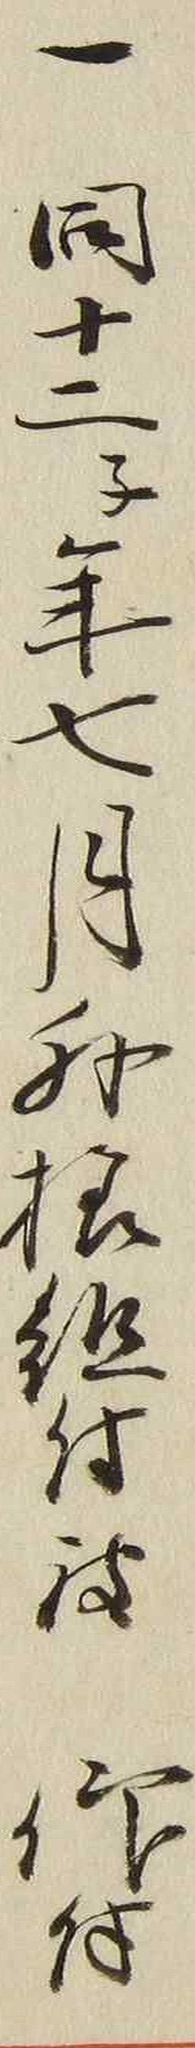一同十二子年七月外様組付被仰付
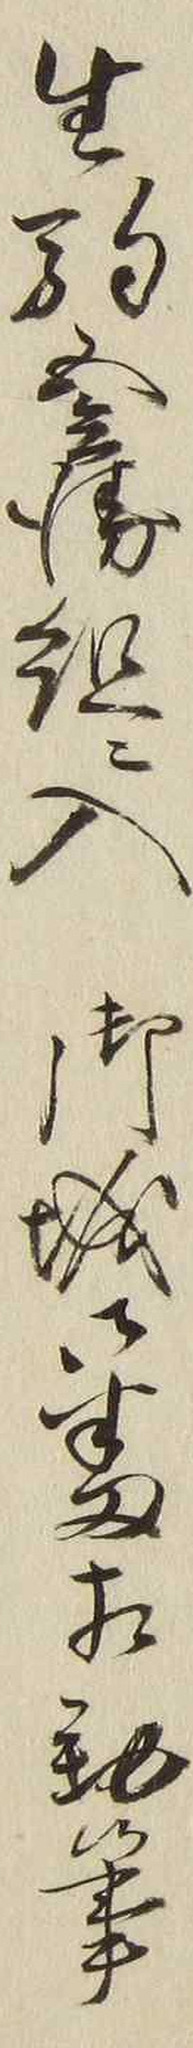生駒五兵衛組に入御城御番相勤候事

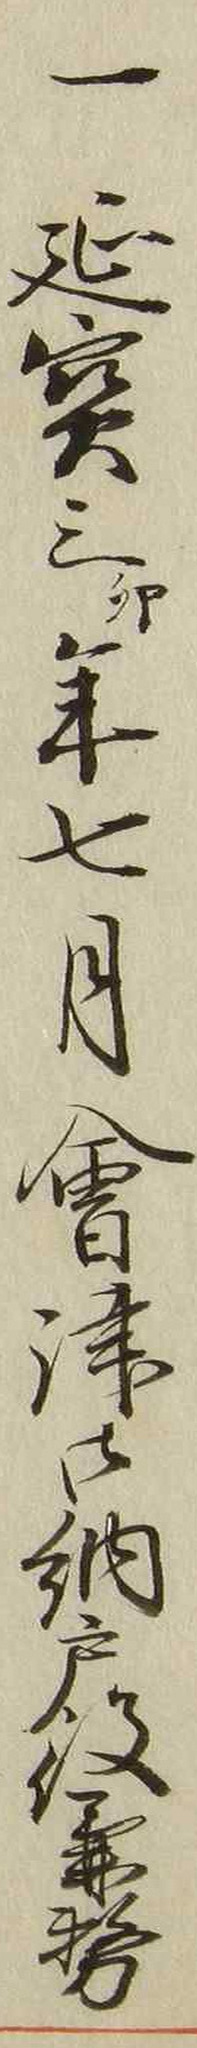一延宝三卯年七月会津御納戸役兼務
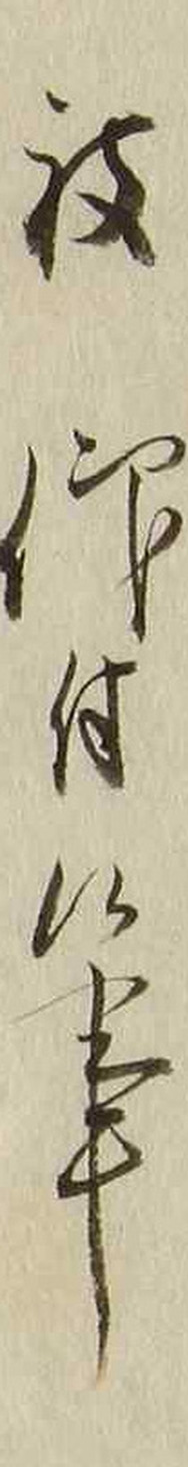被仰付候事
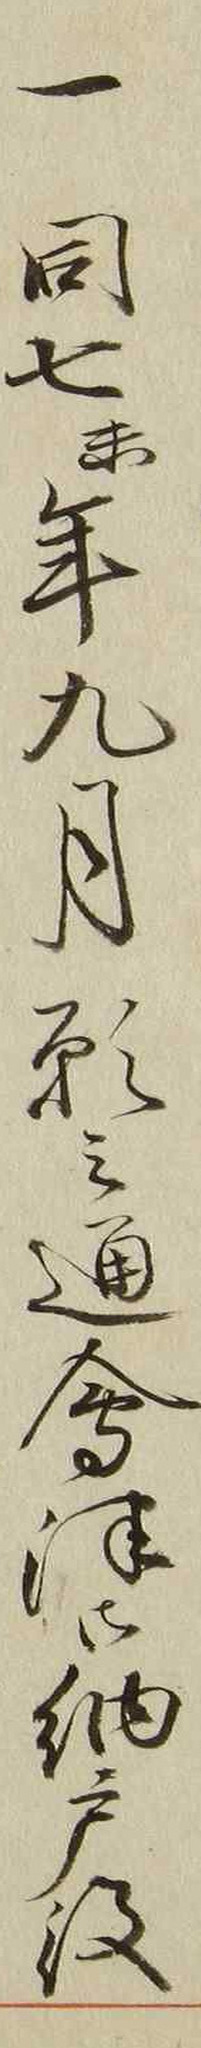一同七未年九月願之通会津御納戸役
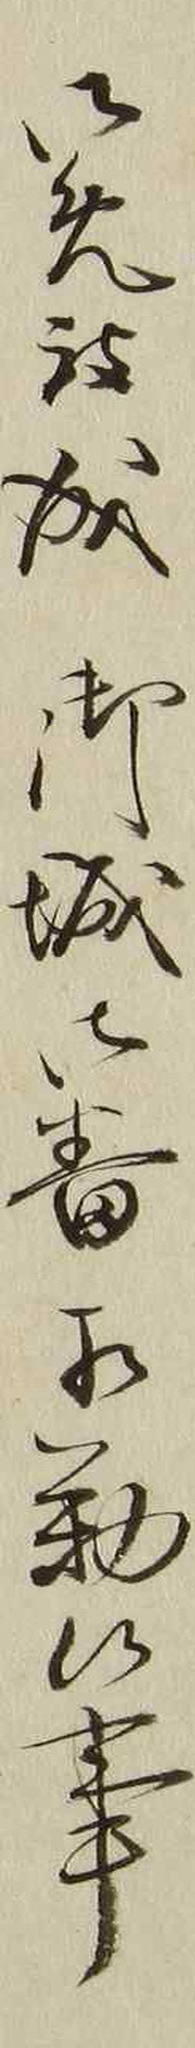御免被成御城御番相勤候事
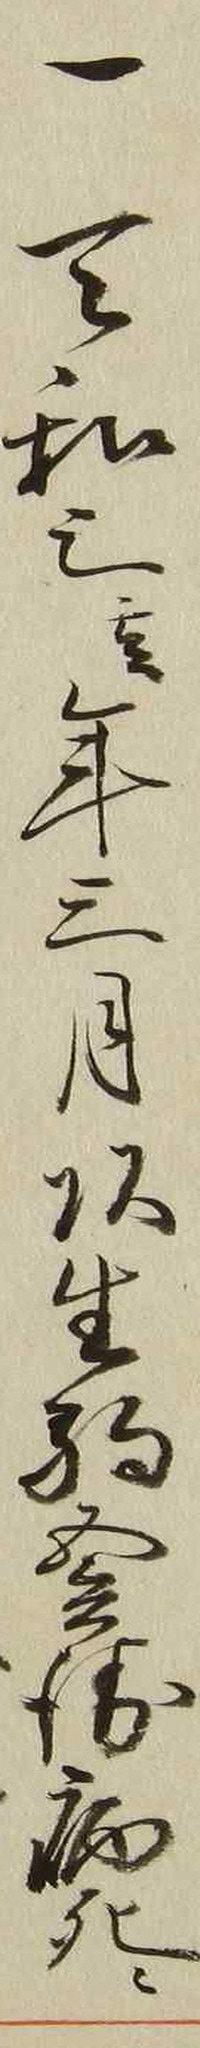一天和三亥年三月頭生駒五兵衛病死に
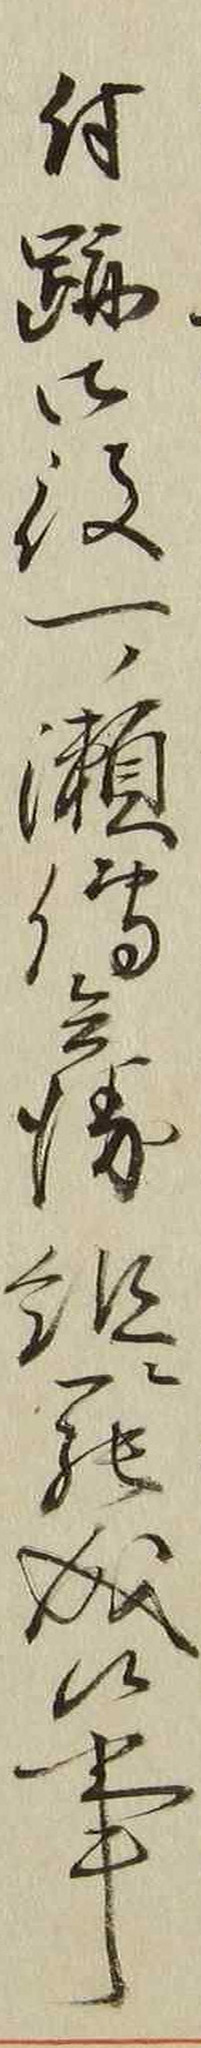付跡御役一ノ瀬伝兵衛組に罷成候事
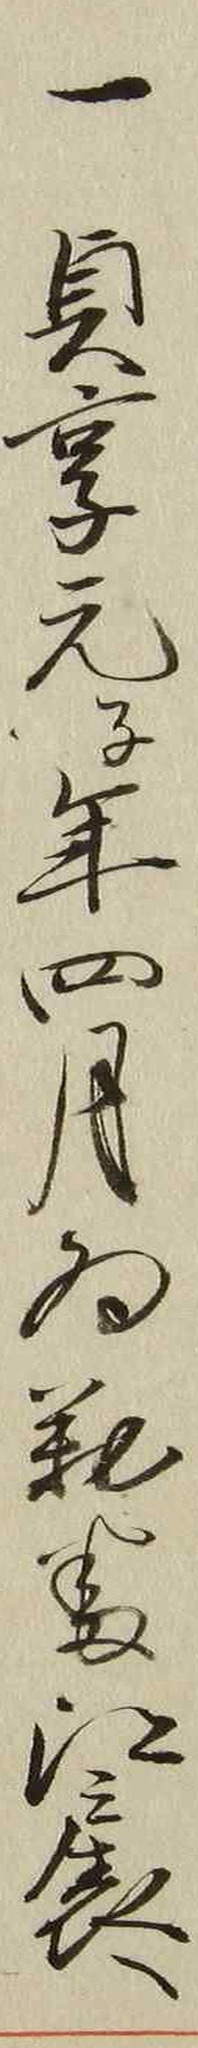一貞享元子年四月為勤番江戸表へ
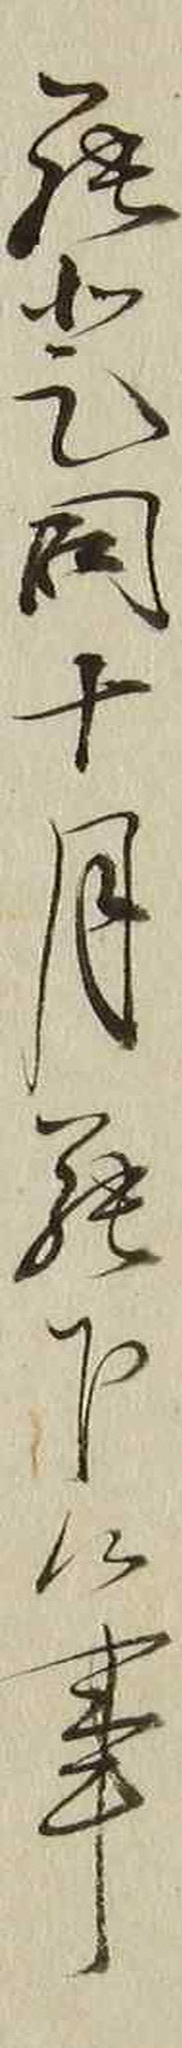罷登同十月罷下候事
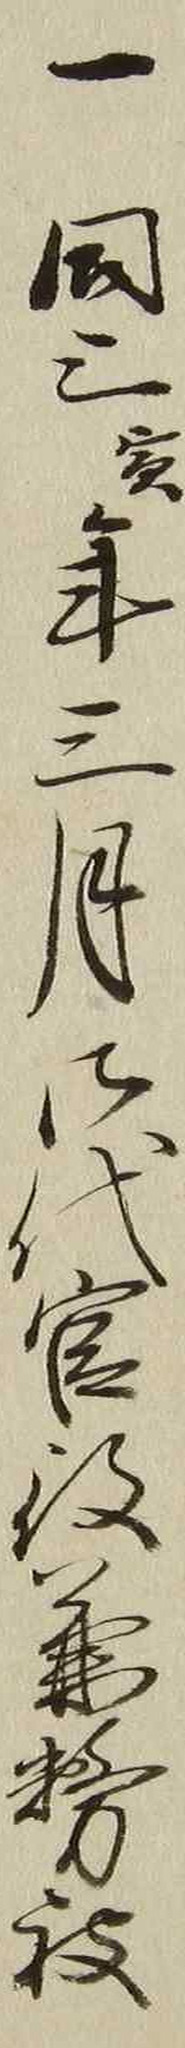一同三寅年三月御代官役兼務被
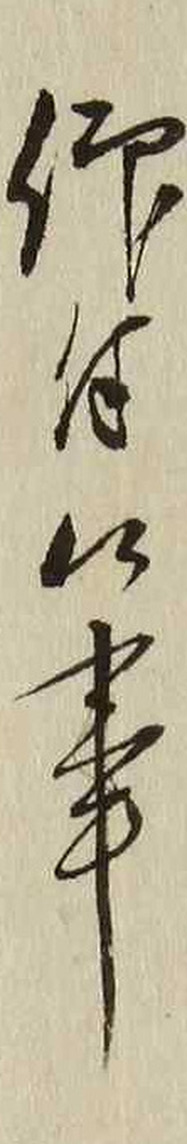仰付候事
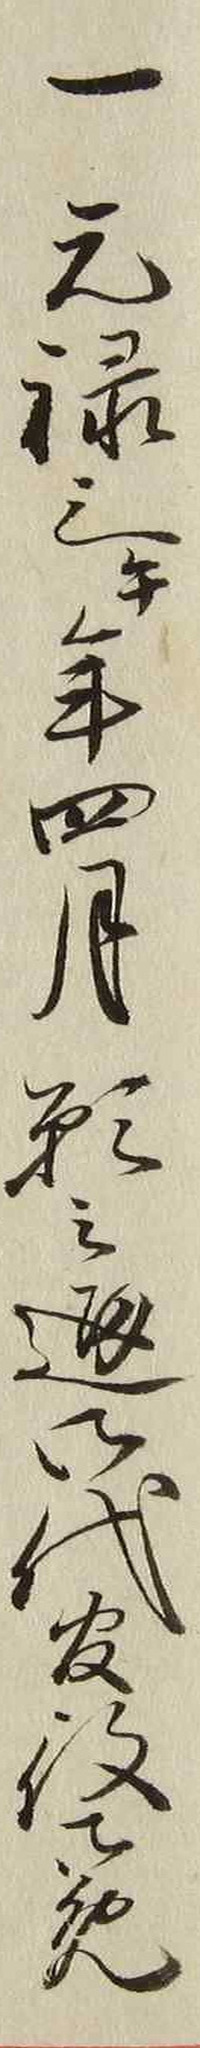一元禄三午年四月願之通御代官役御免
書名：諸士系譜　巻之157　ね之部1
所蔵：会津若松市立会津図書館
